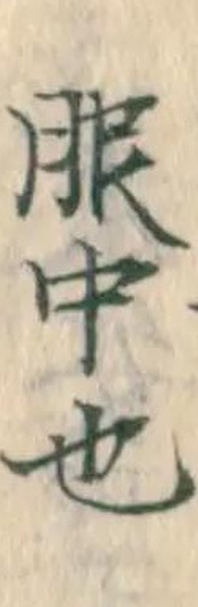服中也
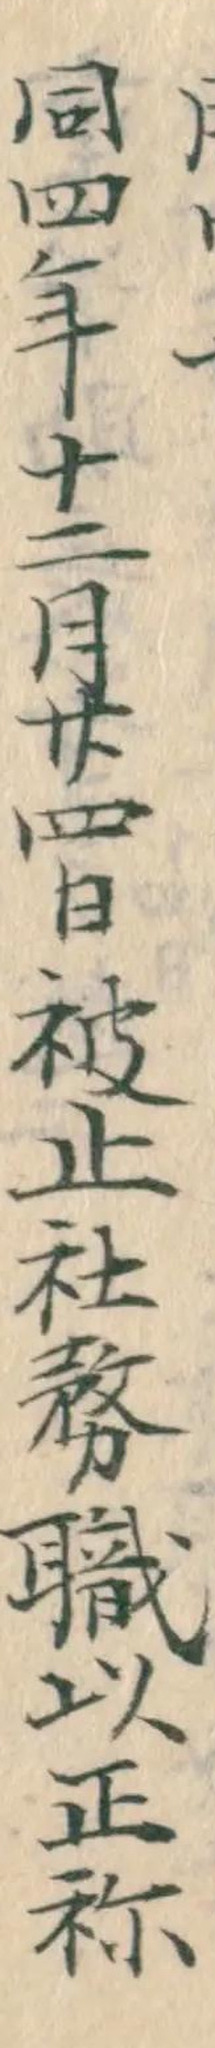同四年十二月廿四日被止社務職以正祢
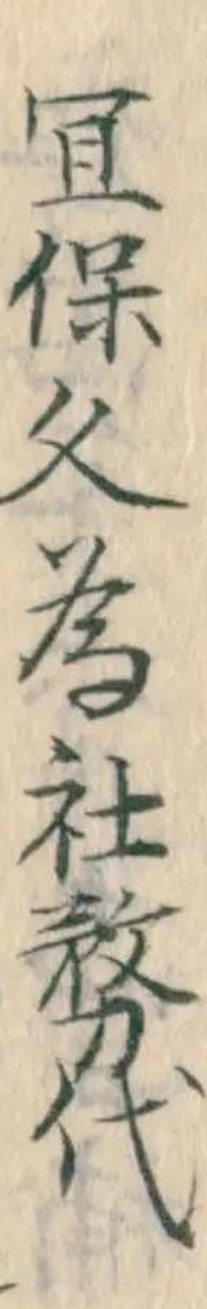宜保久為社務代

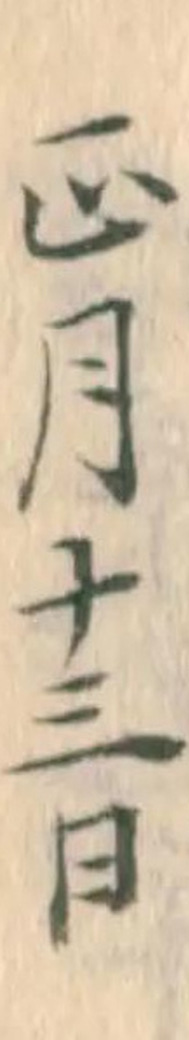八月十六日
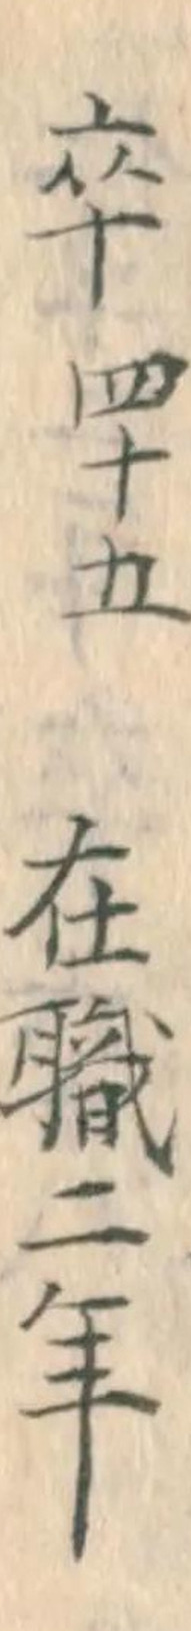卒四十五在職二年
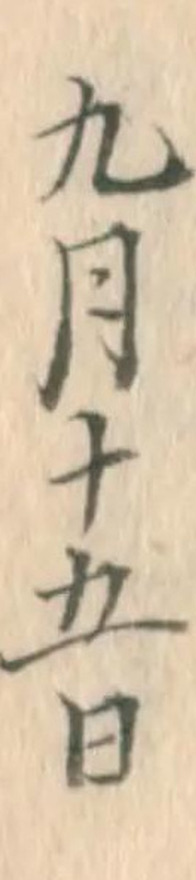八月十六日
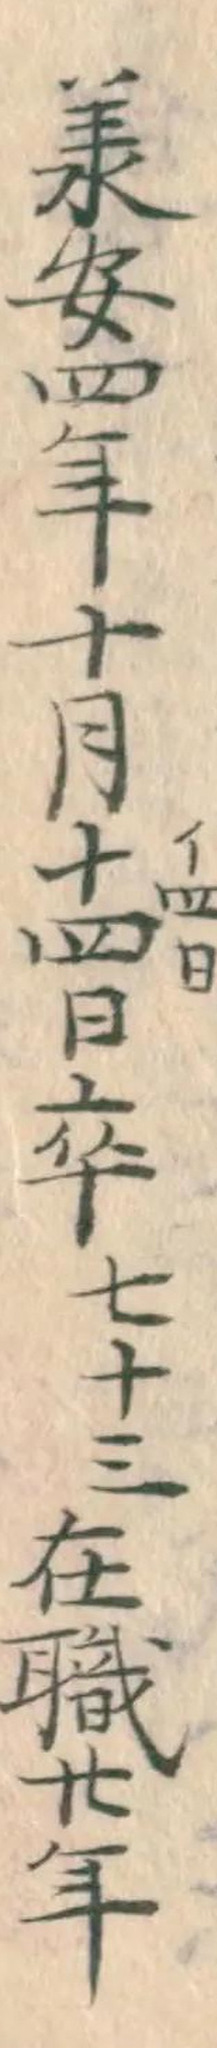承安四年十月十四日卒七十三在職廿年
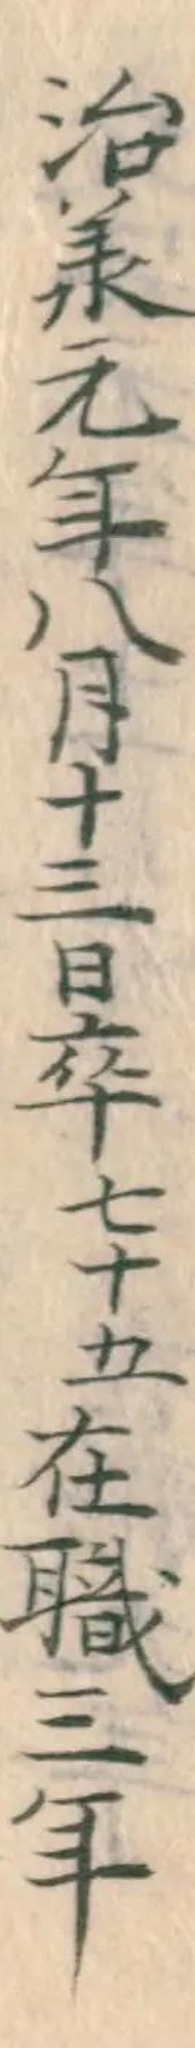治承元年八月十三日卒七十五在職三年
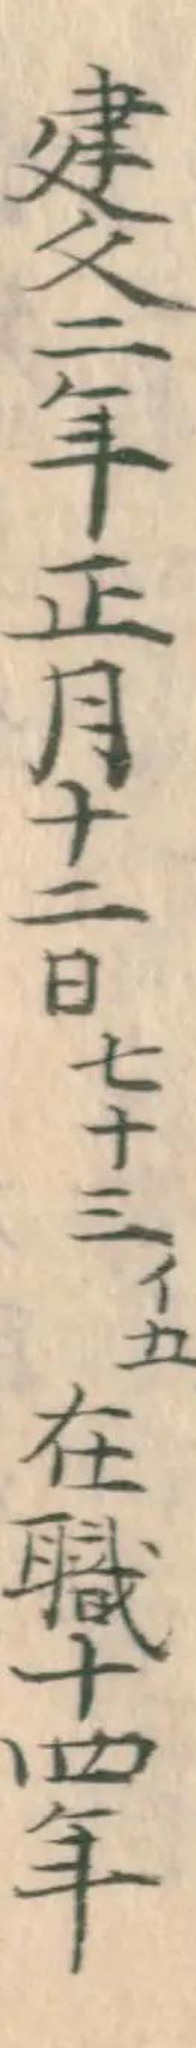建久二年正月十二日七十三在職十四年
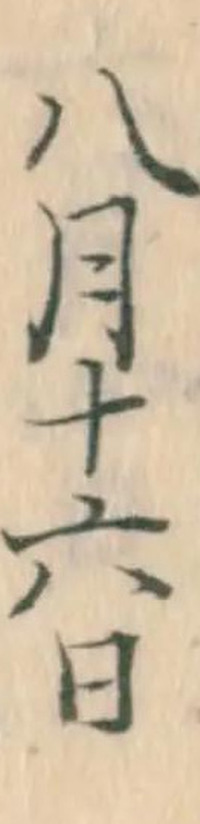八月十六日
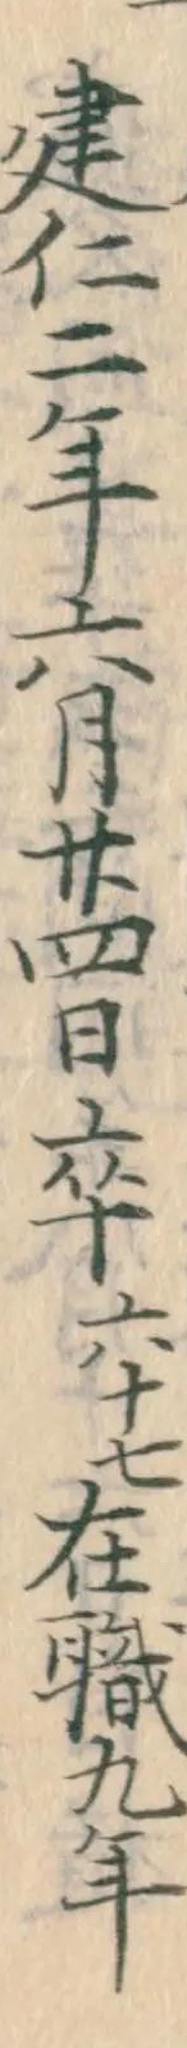建仁二年六月廿四日卒六十七在職九年
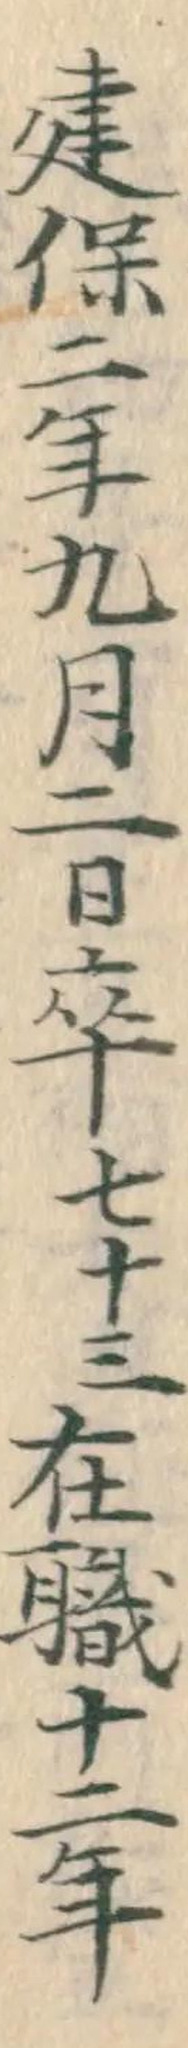建保二年九月二日卒七十三在職十二年
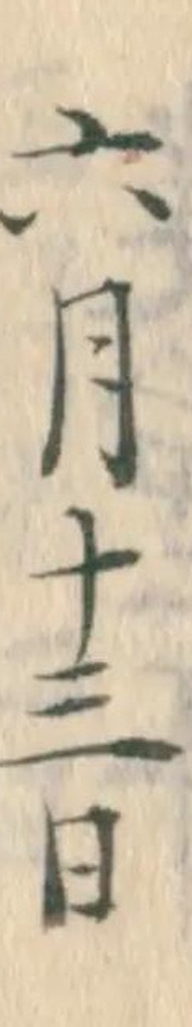八月十六日
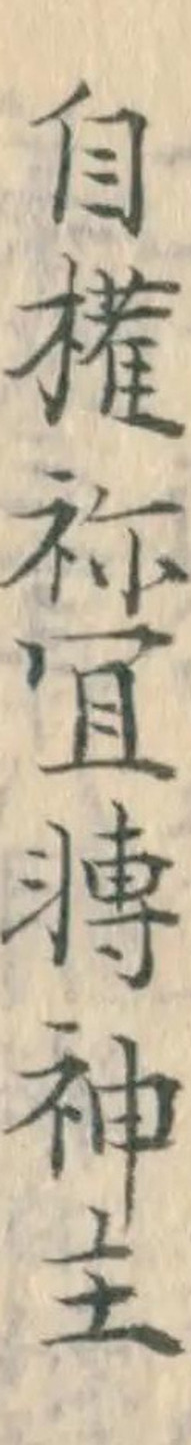自権祢宜転神主

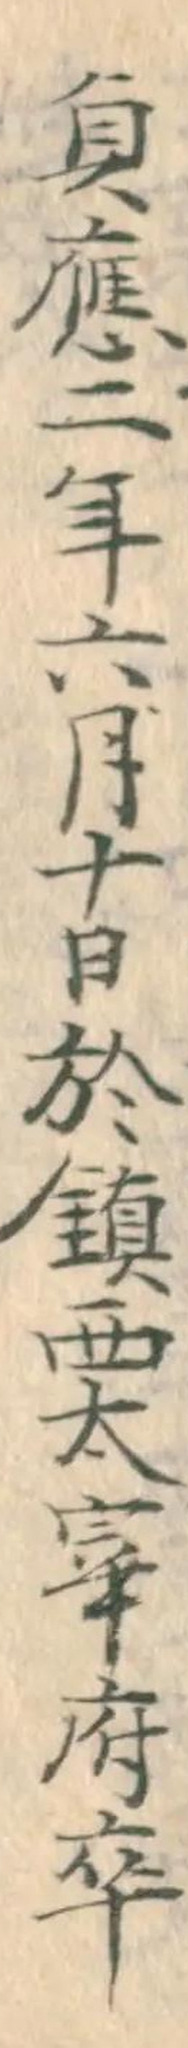貞応二年六月十日於鎮西太宰府卒
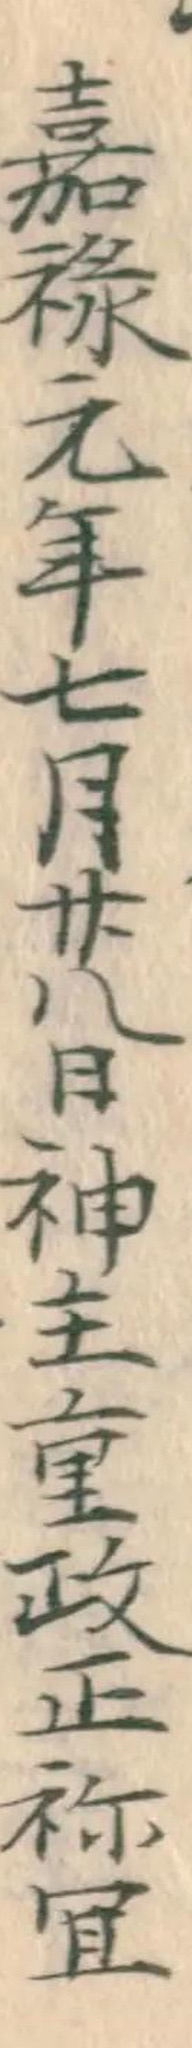嘉禄元年七月廿八日神主重政正祢宜
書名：賀茂社記録. 第23冊
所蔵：国立国会図書館 National Diet Library, JAPAN
